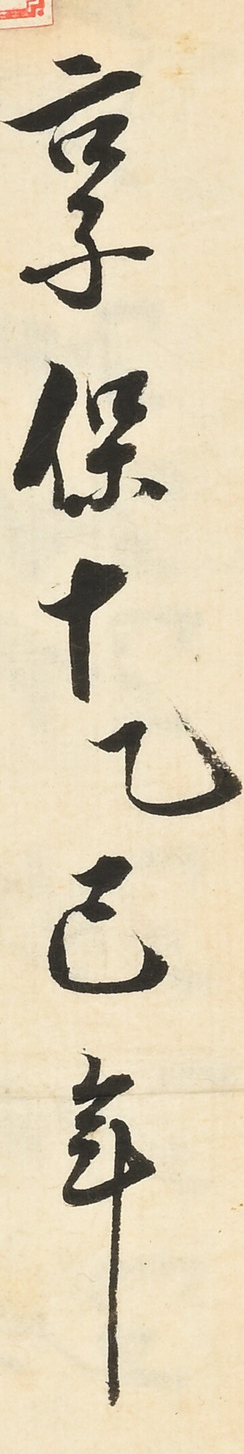享保十乙巳年
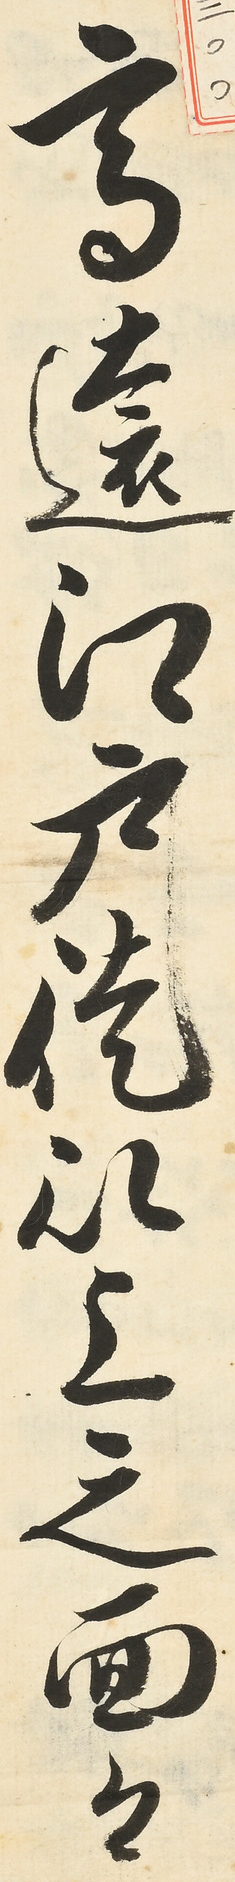高遠江戸徒以上之面々

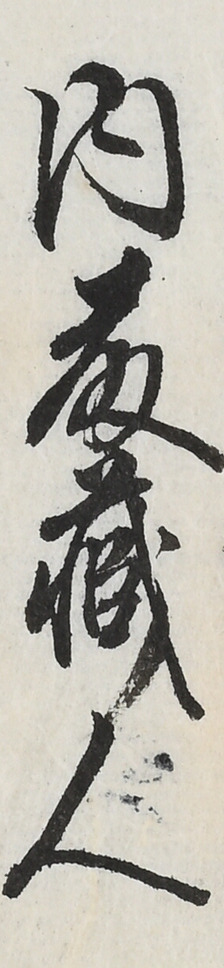内藤蔵人
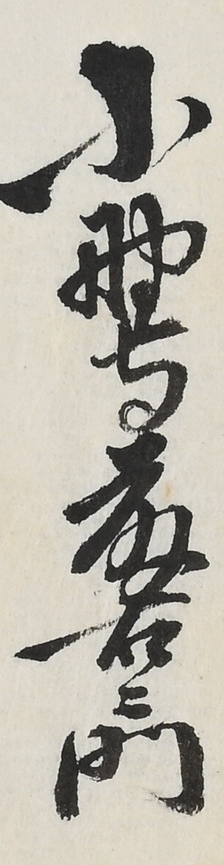小野寺藤右衛門
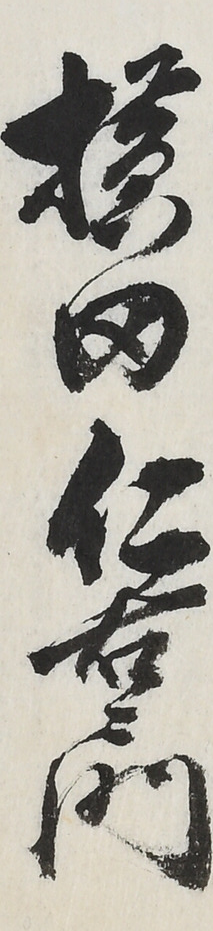横田仁右衛門
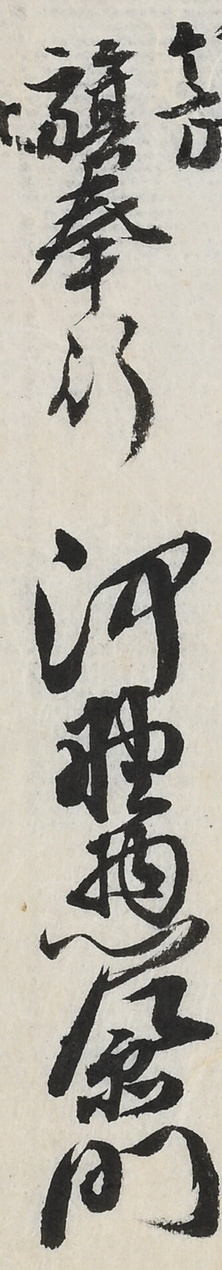旗奉行河野惣左衛門
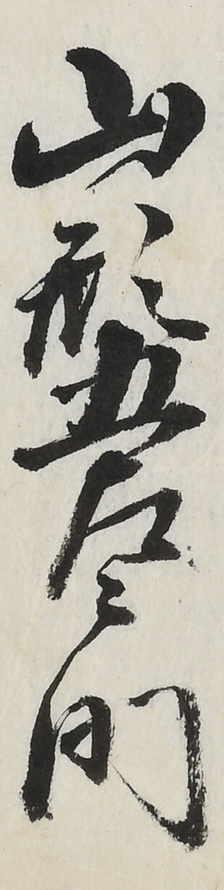山形五左衛門
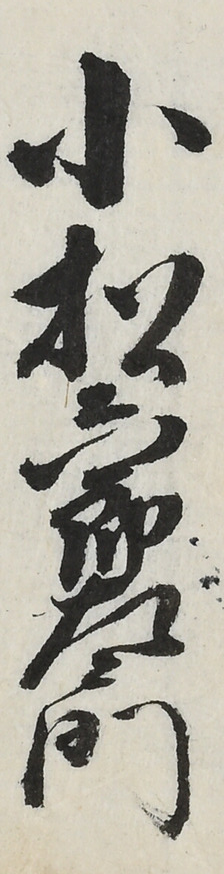小松六郎左衛門
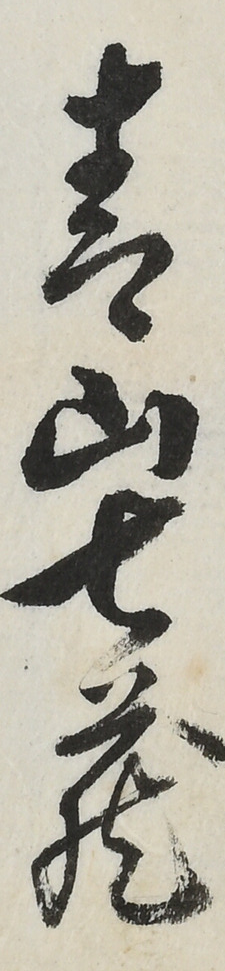青山七蔵
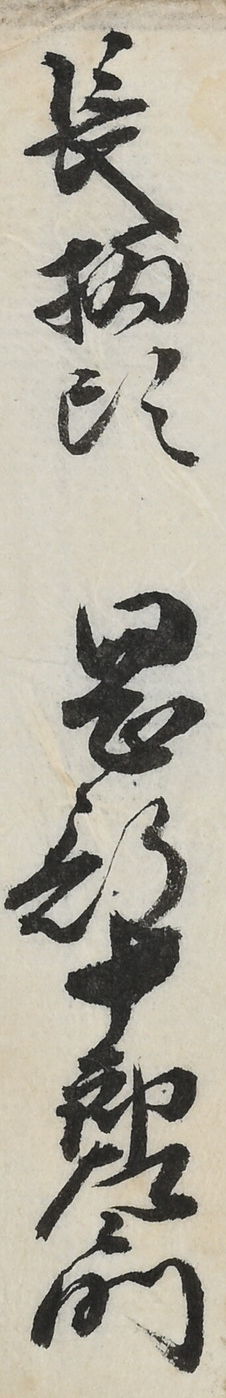長柄頭岡部十郎左衛門

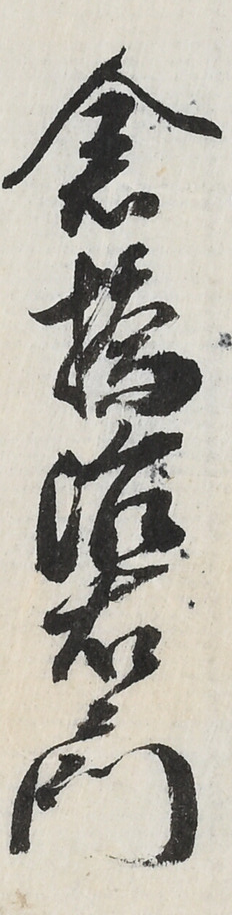倉橋治右衛門
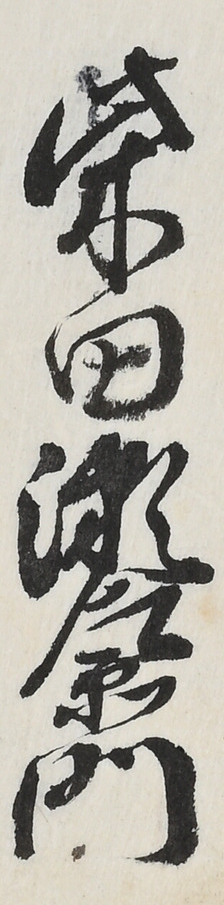柴田瀬左衛門
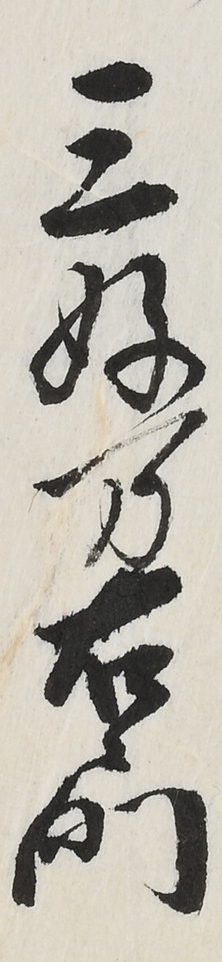三好万右衛門
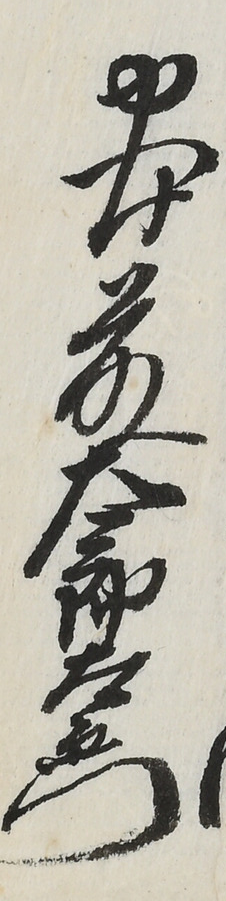安藤太郎左衛門
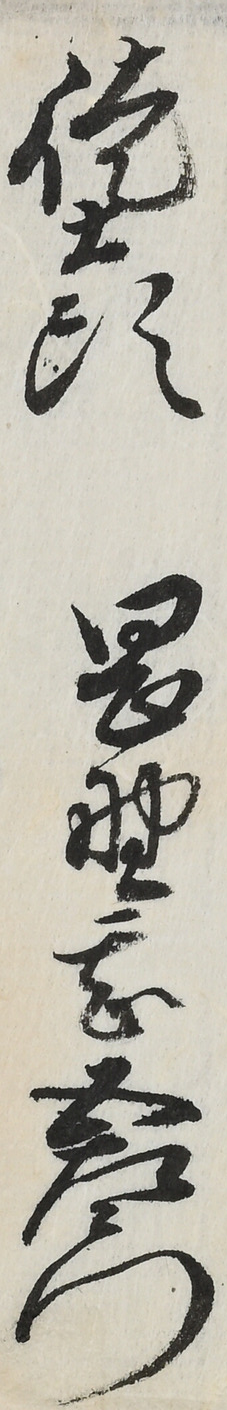徒士頭岡野甚五左衛門

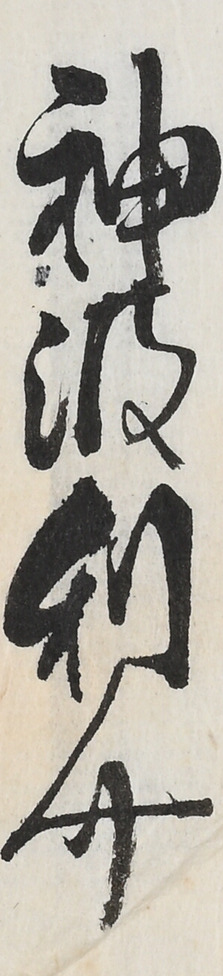神波利介
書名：高遠江戸徒以上之面々
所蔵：伊那市立高遠町図書館・合同会社AMANE
